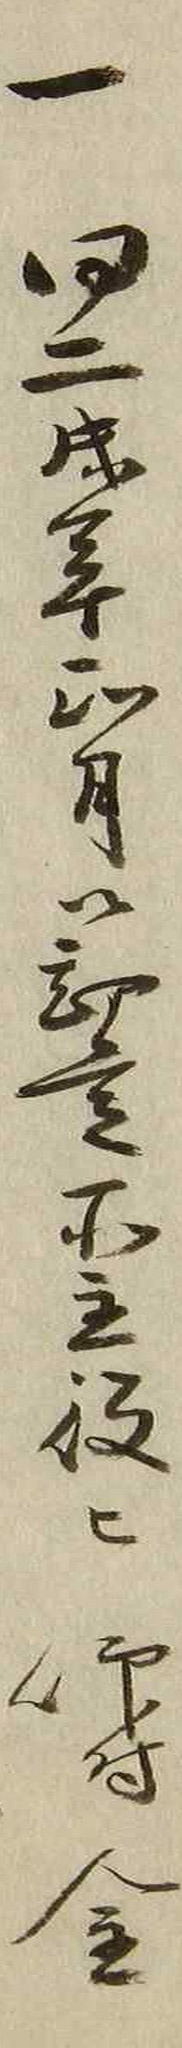一同二戌年正月御勘定所主役被仰付金
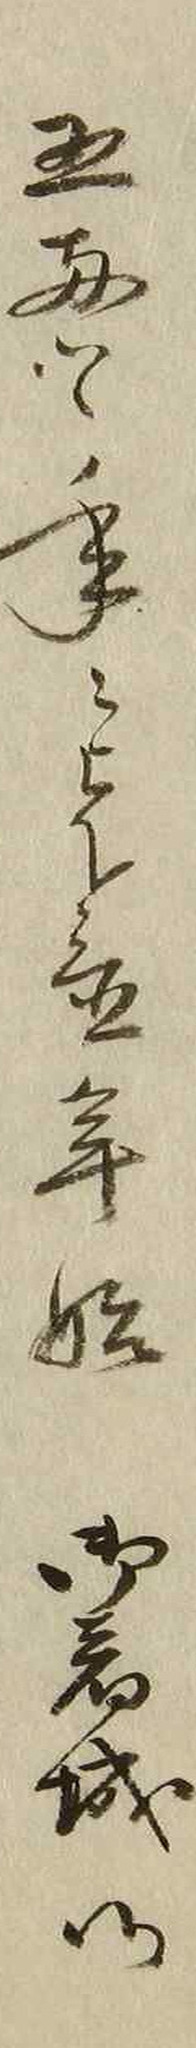五両ツヽ年々被下置年始御着城御
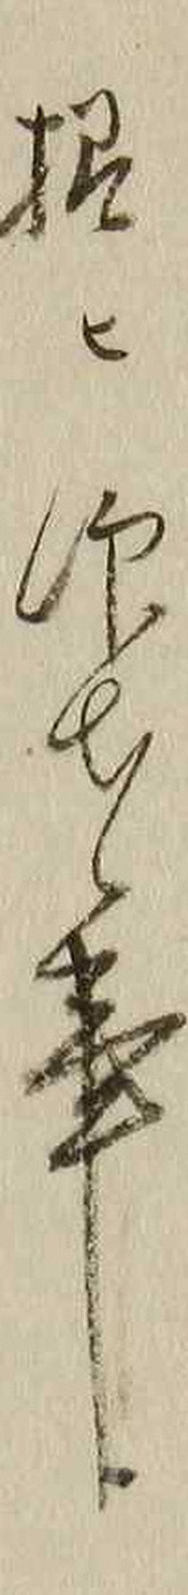様被仰出候事
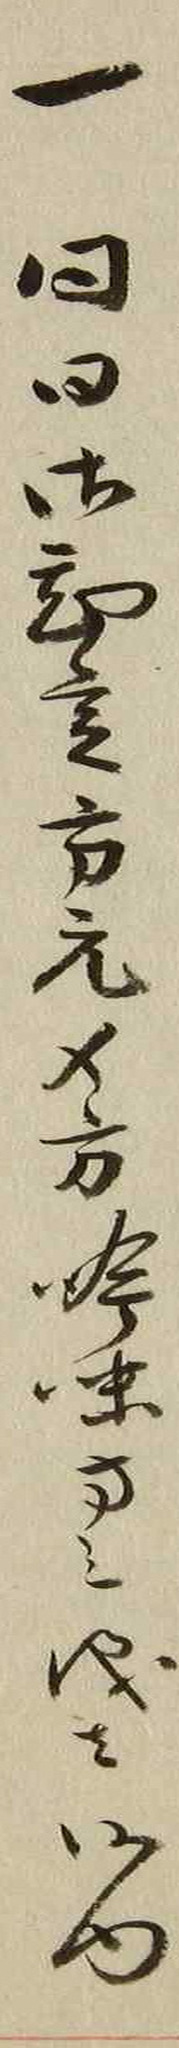一同日御勘定方元〆方吟味方之儀者御内
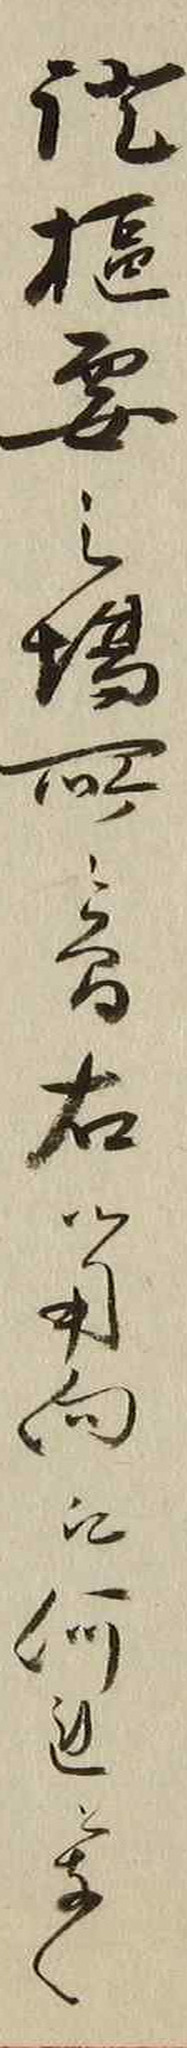証枢要之場所ニ候間右御用向江何れとなく
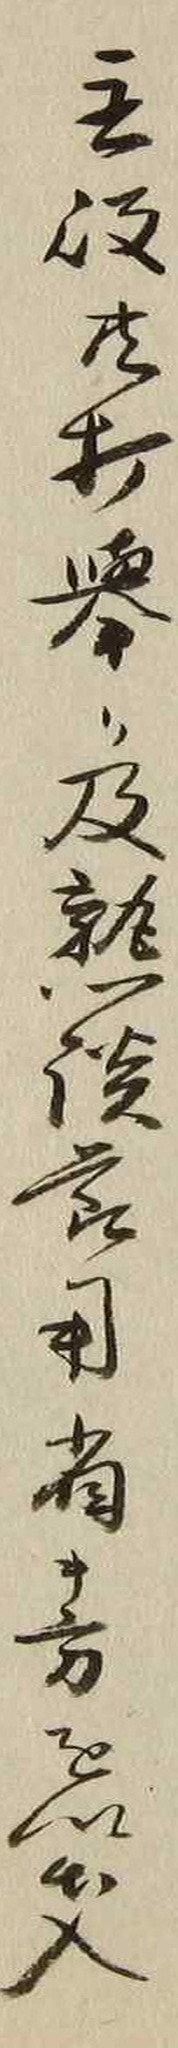主役共打挙り及熟談節用省キ方を以出入
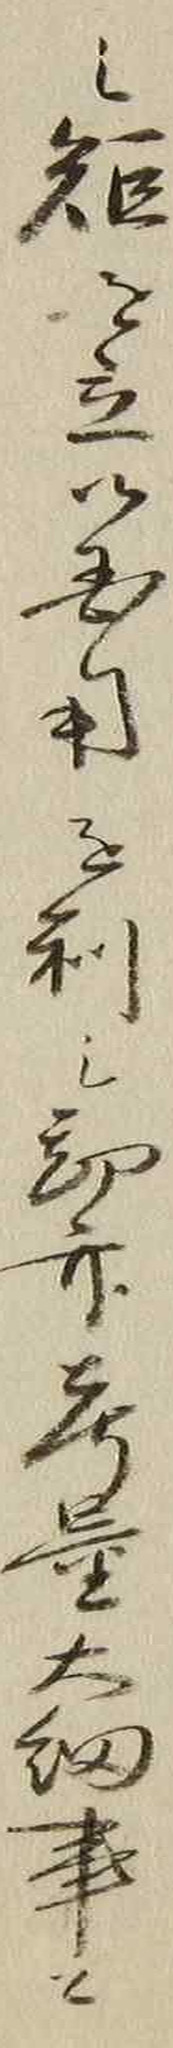之矩を立御国用を利シ勘弁考量大細事と
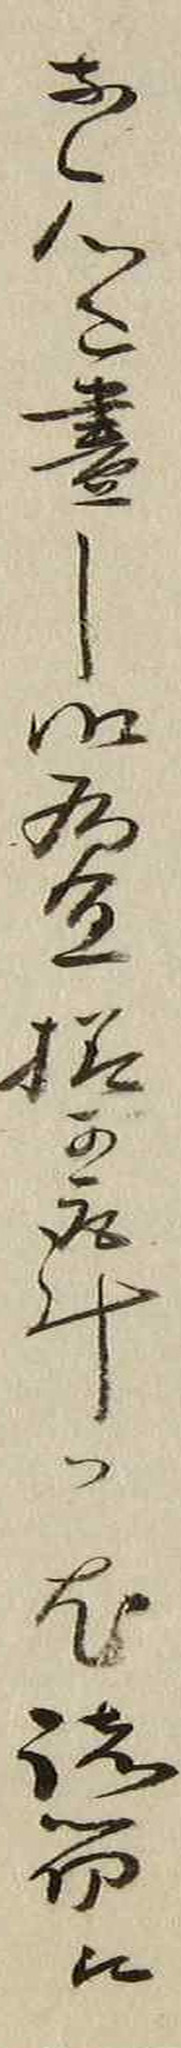なく心を尽し御為宜様可取計候尤諸筋江
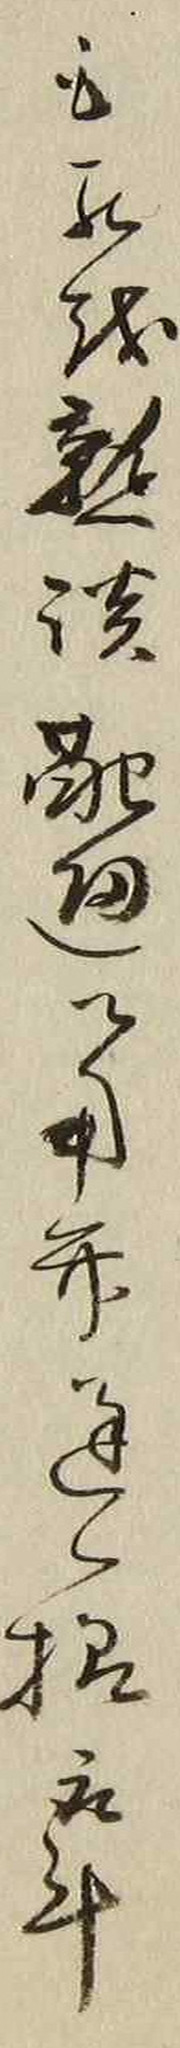も罷越熟談融通御用弁達候様取計
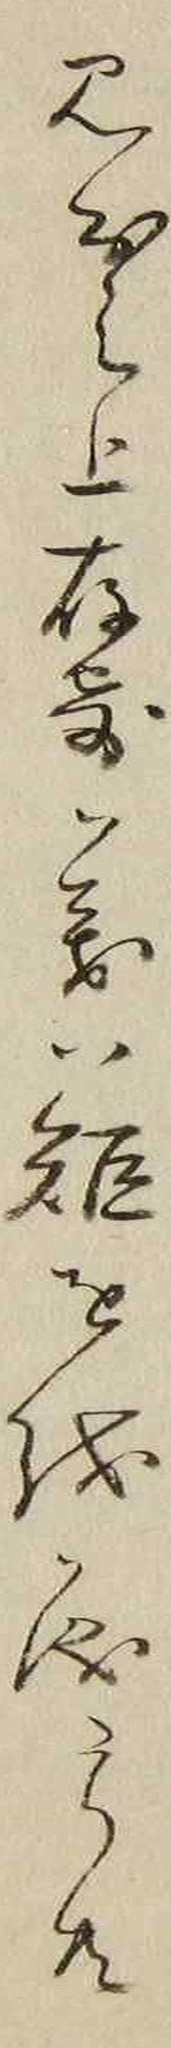見分之上存寄候義ハ矩を越候儀たり共
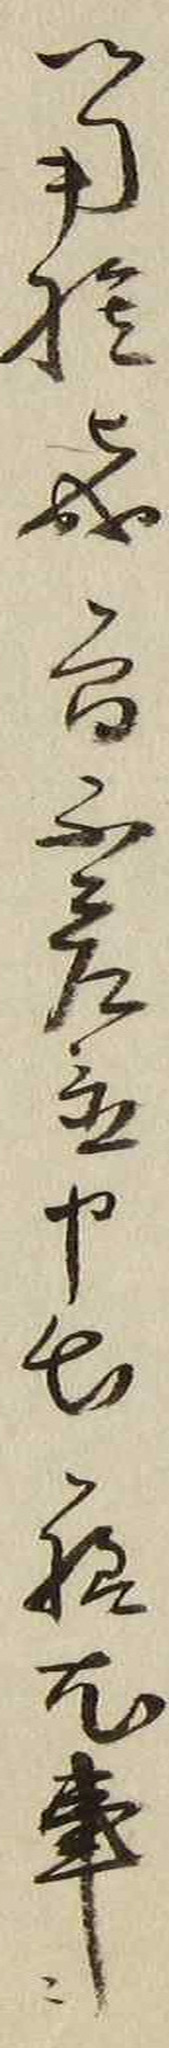御用捨被成候間不差置申出候様尤事
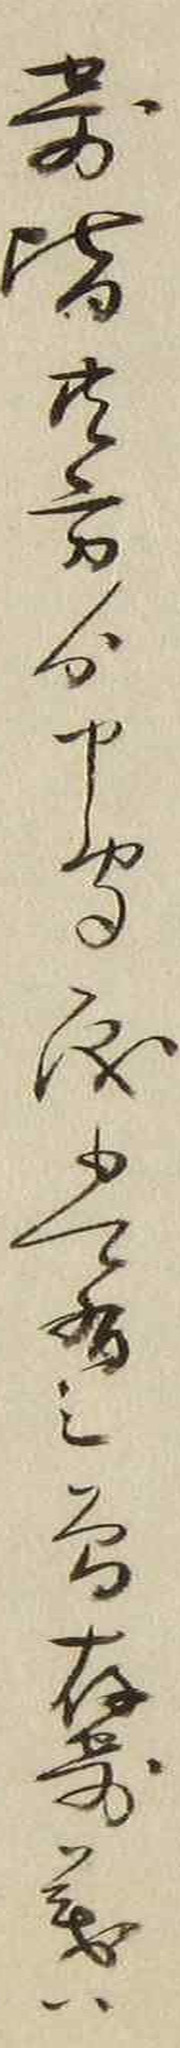寄皆共方ゟ申聞候儀も可有之候間存寄候義ハ
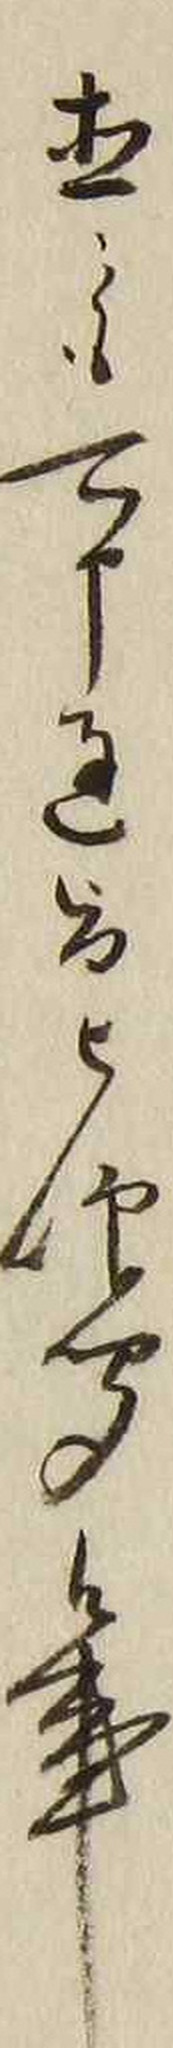直ニも可申達旨被仰聞候事
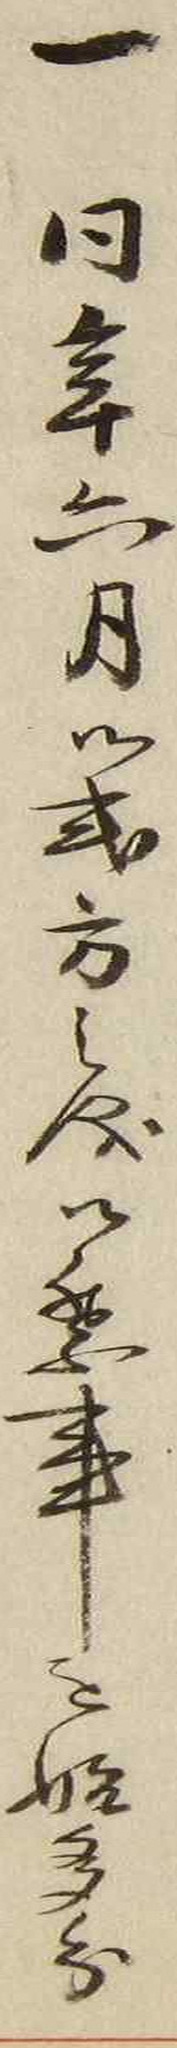一同年六月御式方之儀御祭事を始多分

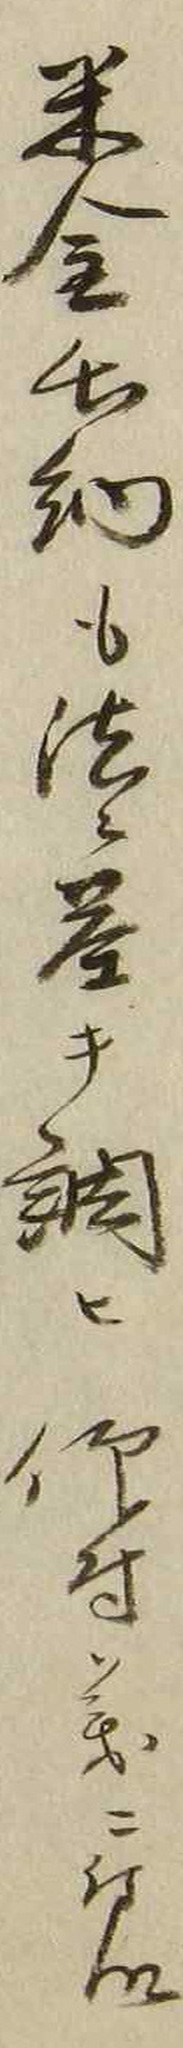米金出納も法ニ差キ調被仰付候義ニ付御
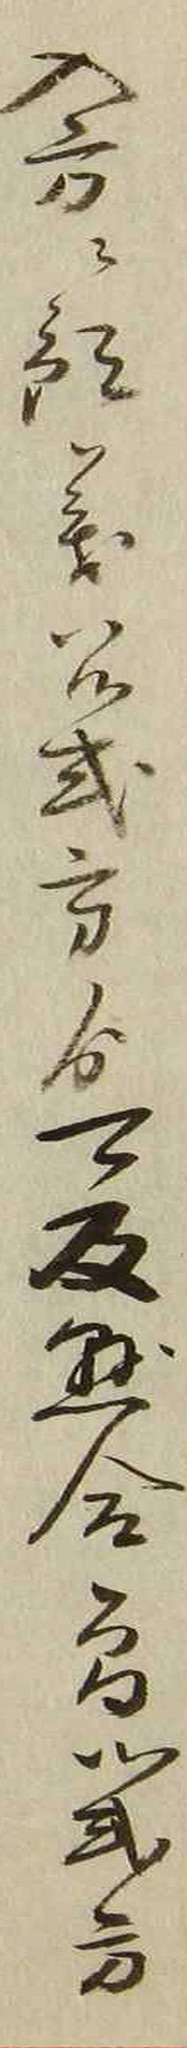入方ニ預候義ハ御式方ゟ可及懸合候間御式方
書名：諸士系譜　巻之311　し之部1
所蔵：会津若松市立会津図書館
